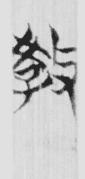教
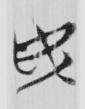𡚦
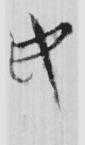女
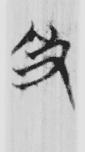及
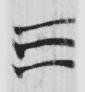三
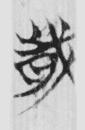歲
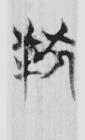幸
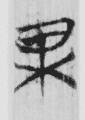果
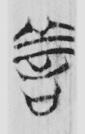善
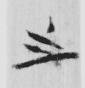之
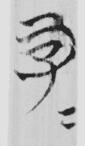乳=
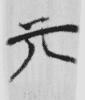亓
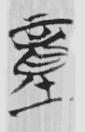童
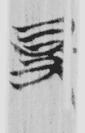𠭁
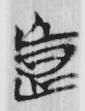良
